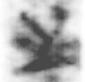之
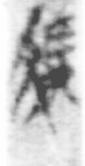駟
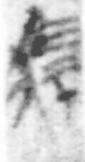駐
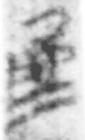爲
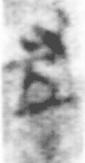○（右）
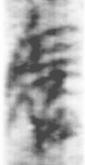○（服）
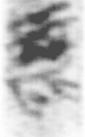麗
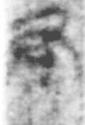君
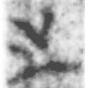之
